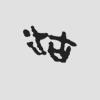姑
